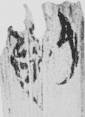飤（食）
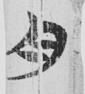肉
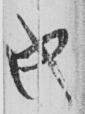女（如）
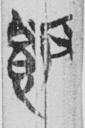飯
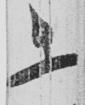土
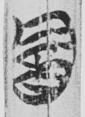酓（飲）
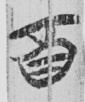酉（酒）
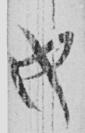女（如）
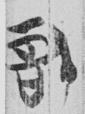信
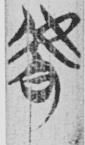○（乎）
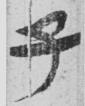子
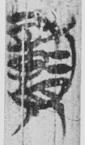贛（貢）
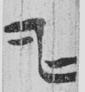曰
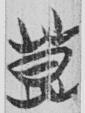莫
